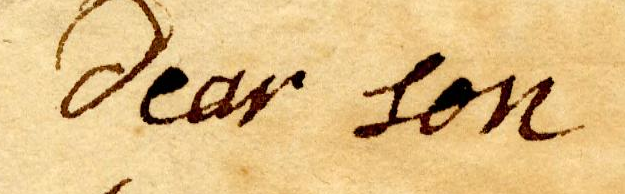dear son
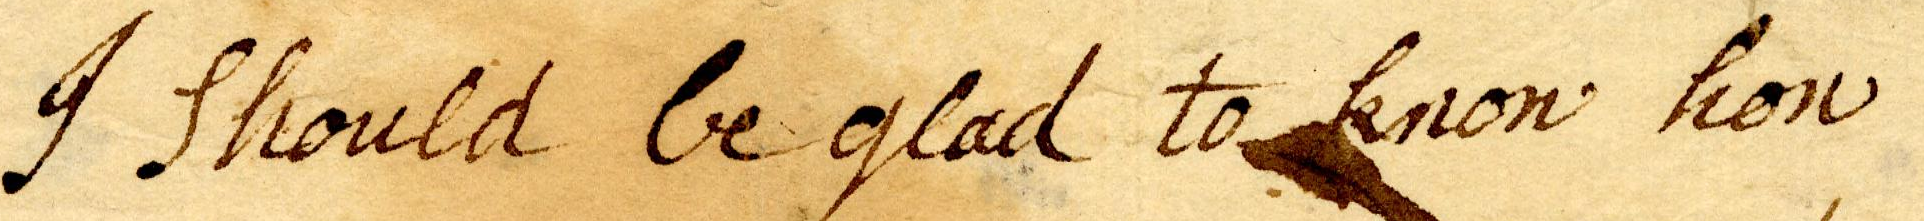I should be glad to know how
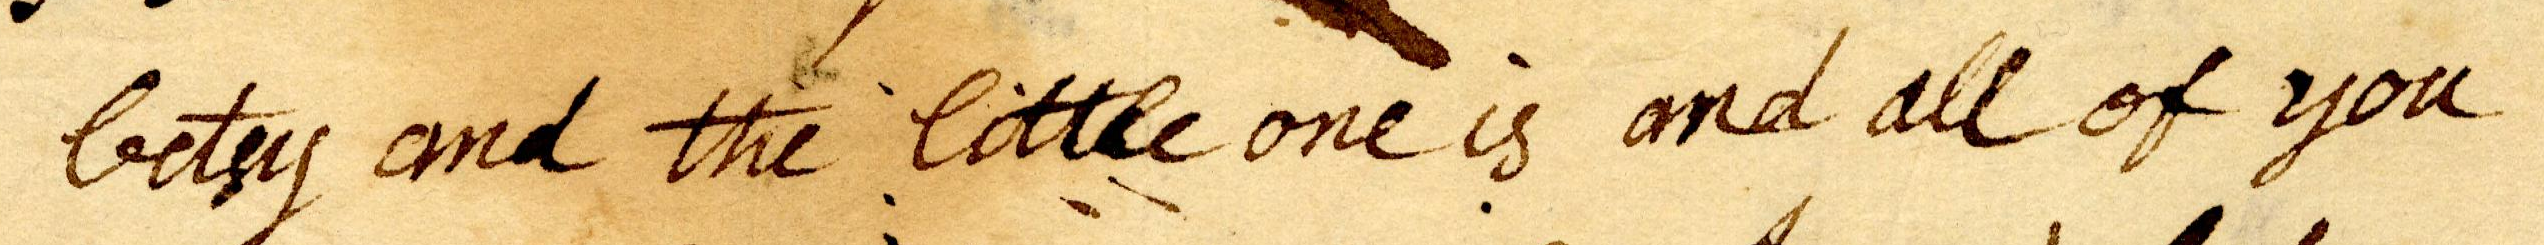besty and the little one is and all of you
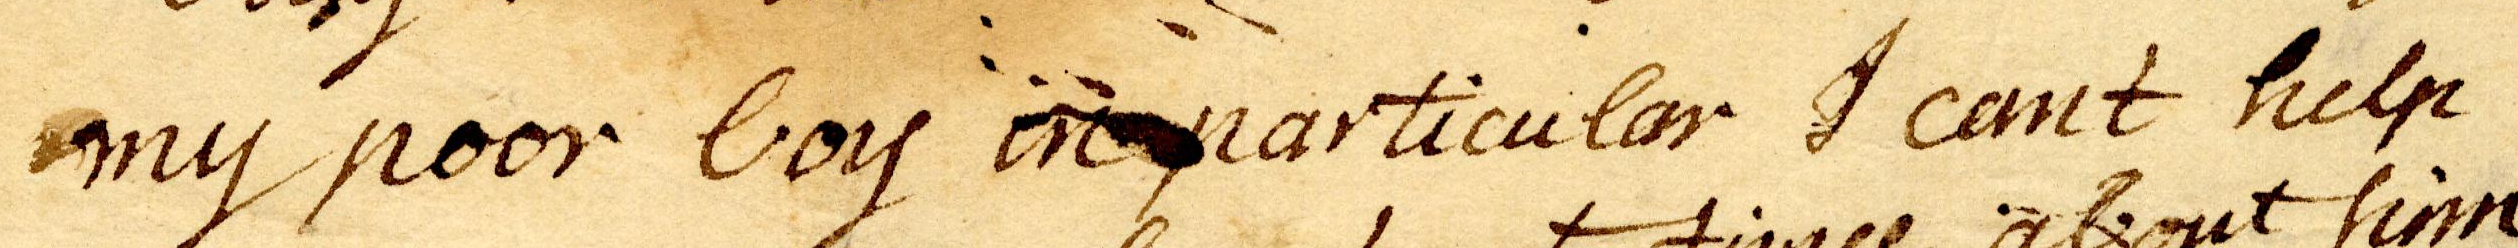my poor boy in particular I cant help
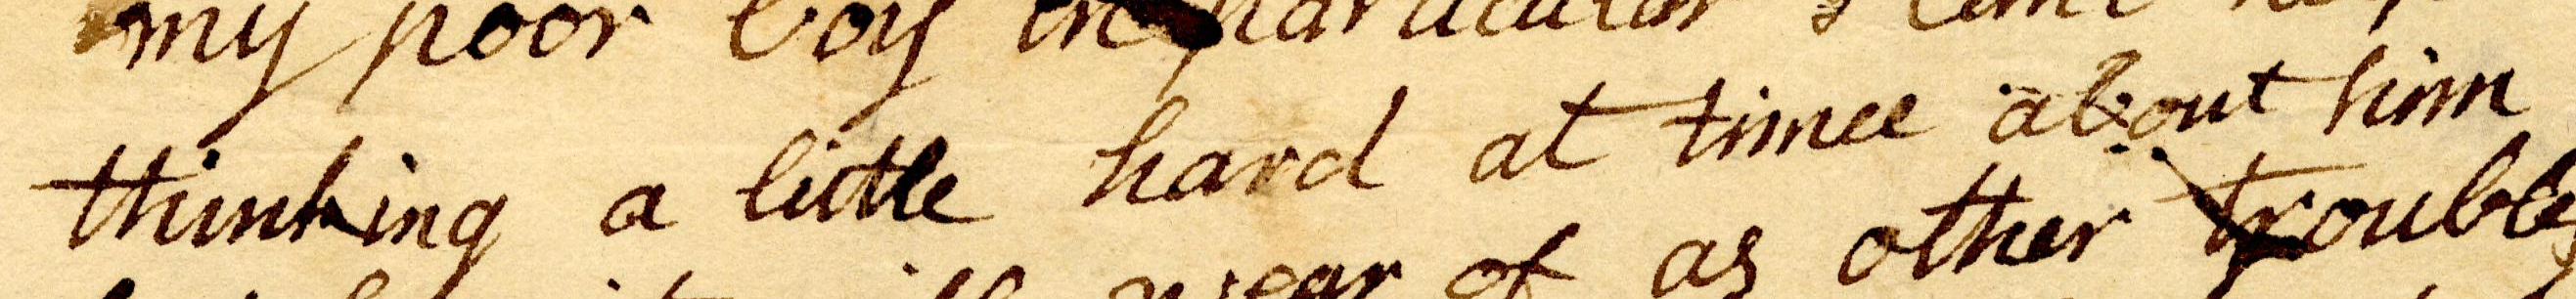thinking a little hard at times about him
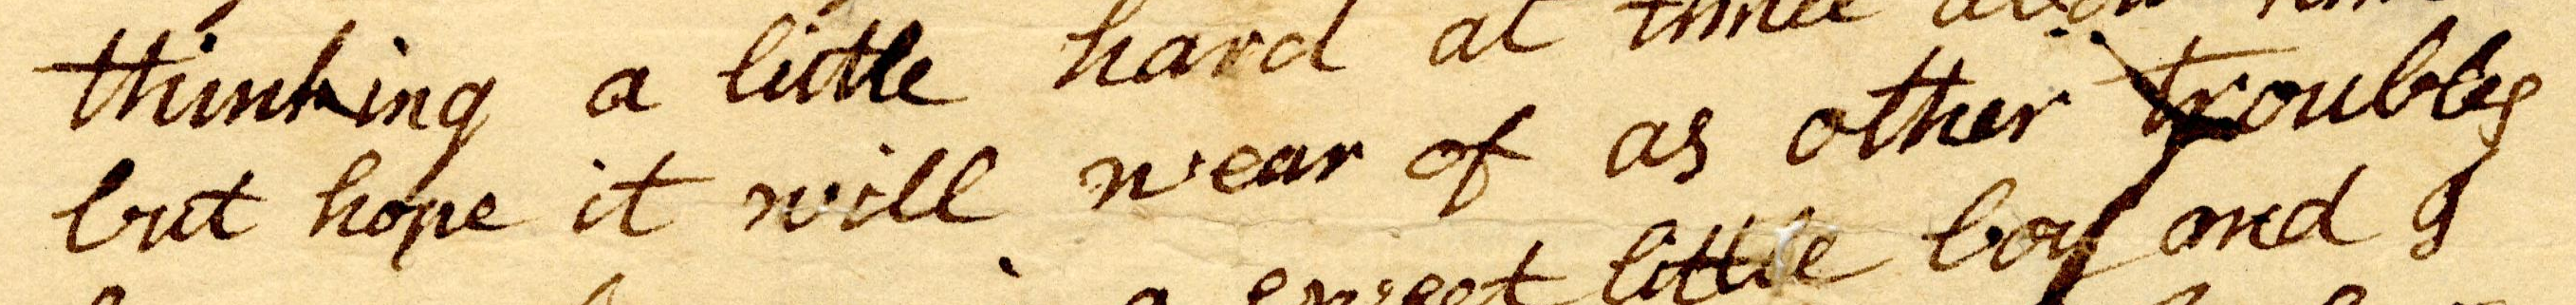but hope it will wear of as other troubles
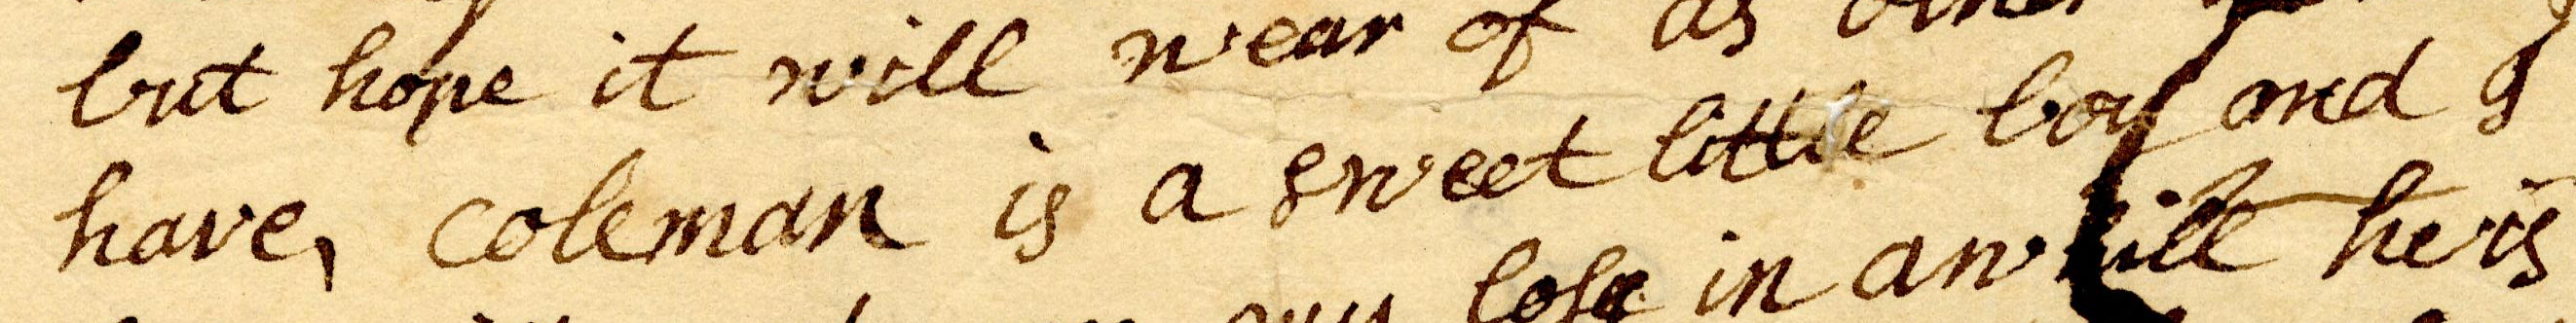have, coleman is a sweet little boy and I
